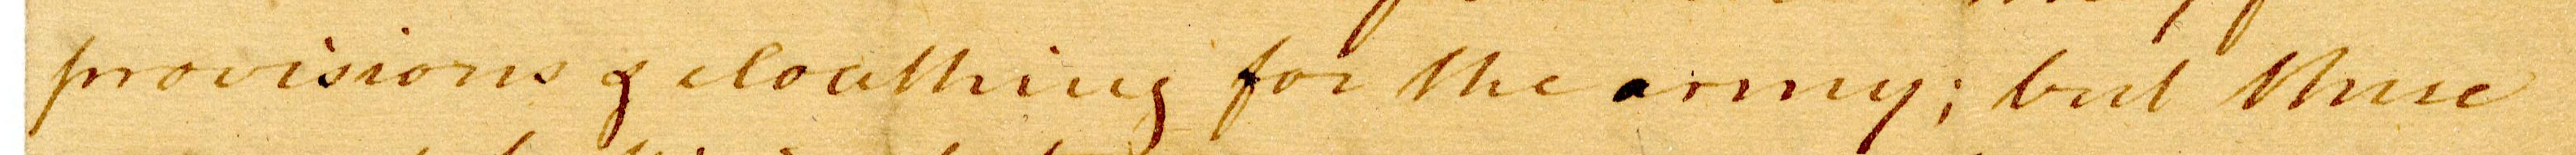provisions & cloathing for the army; but these
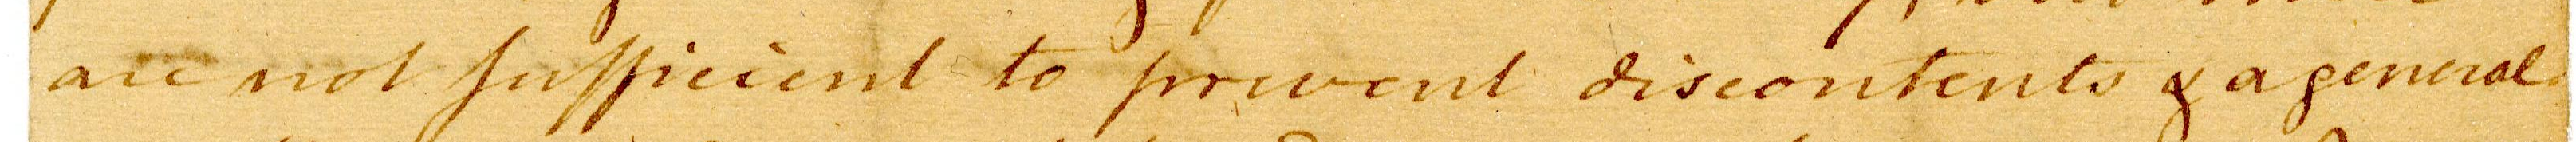are not sufficient to prevent discontents & a general
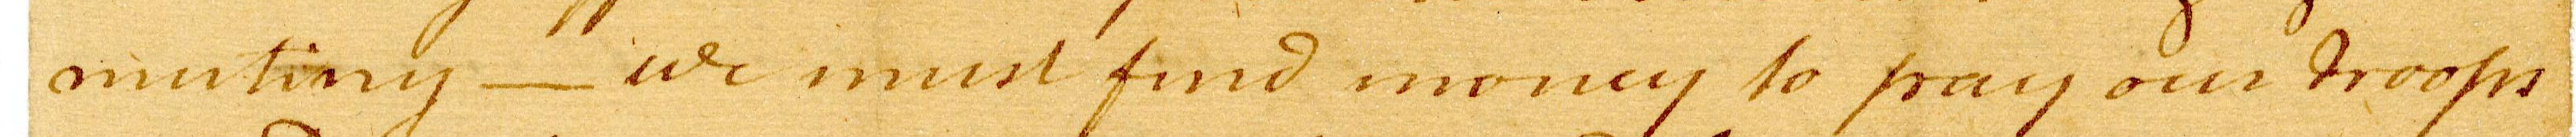mutiny- we must find money to pay our troops
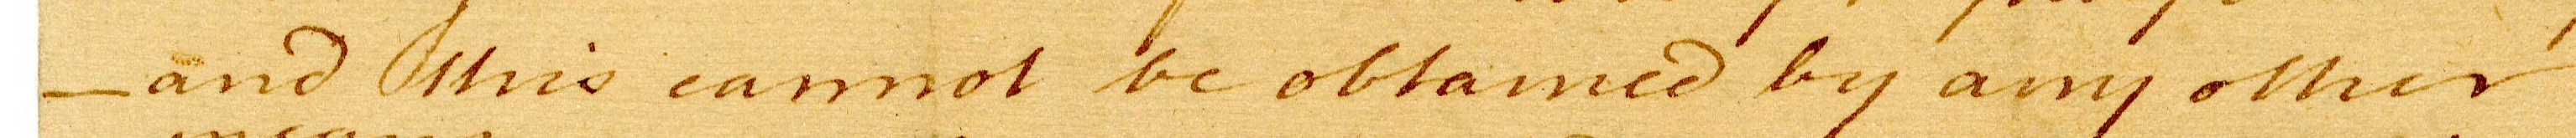-and this cannot be obtained by any other
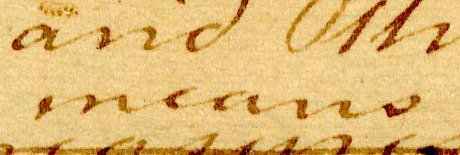means
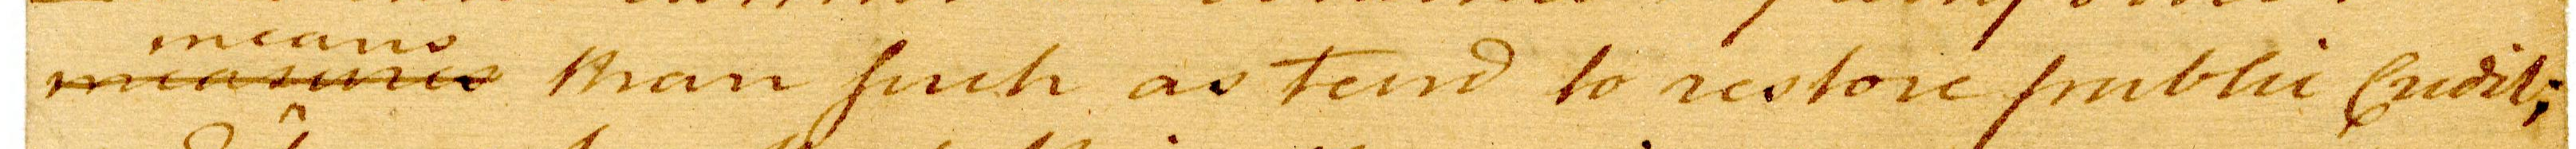[measures] than such as tend to restore public Credit;
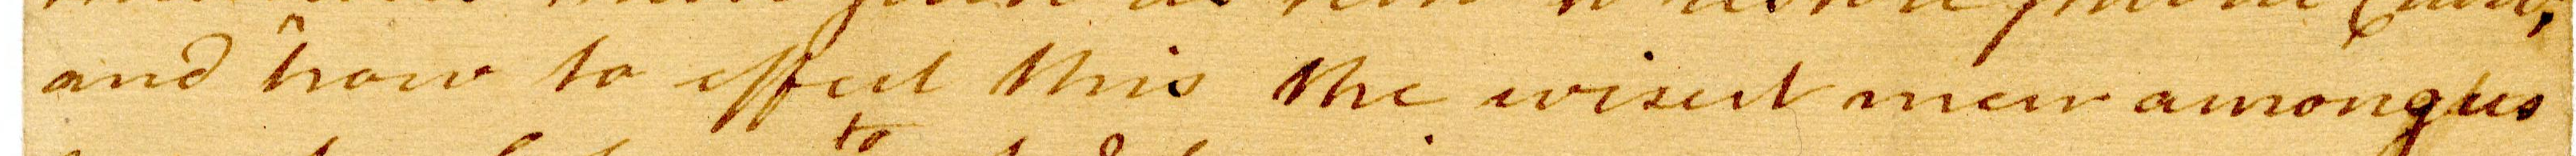and how to effect this the wisest men among us
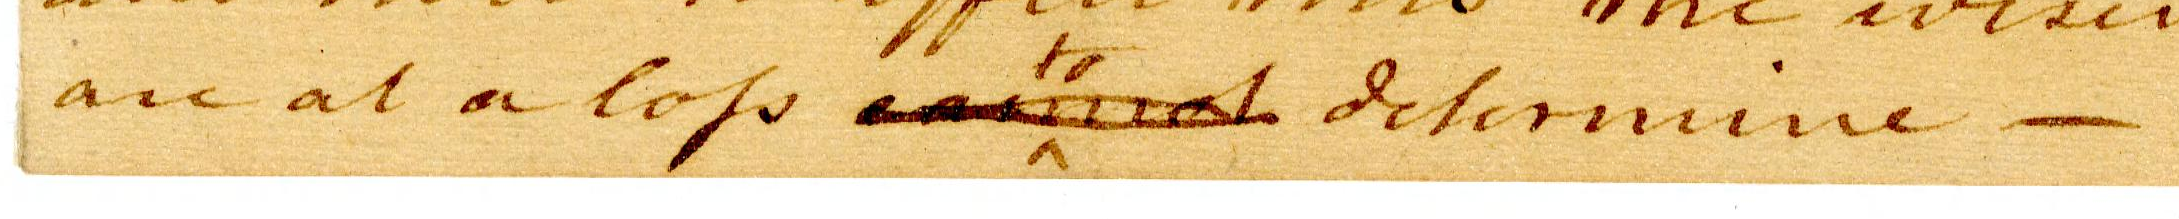are at a loss [cannot] determine-
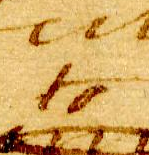to
